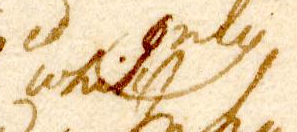white only
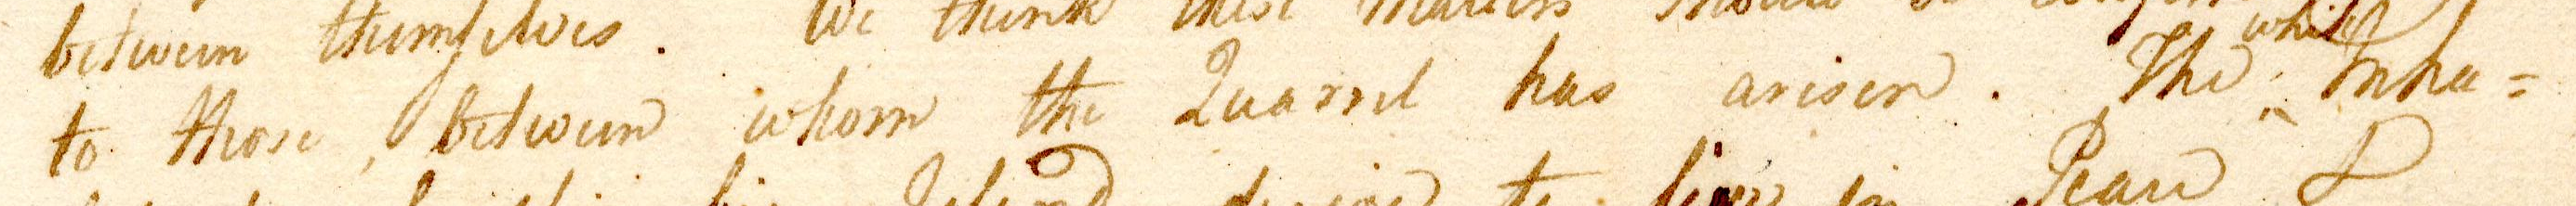to those between whom the Quarrel has arisen. The ^ Inha-
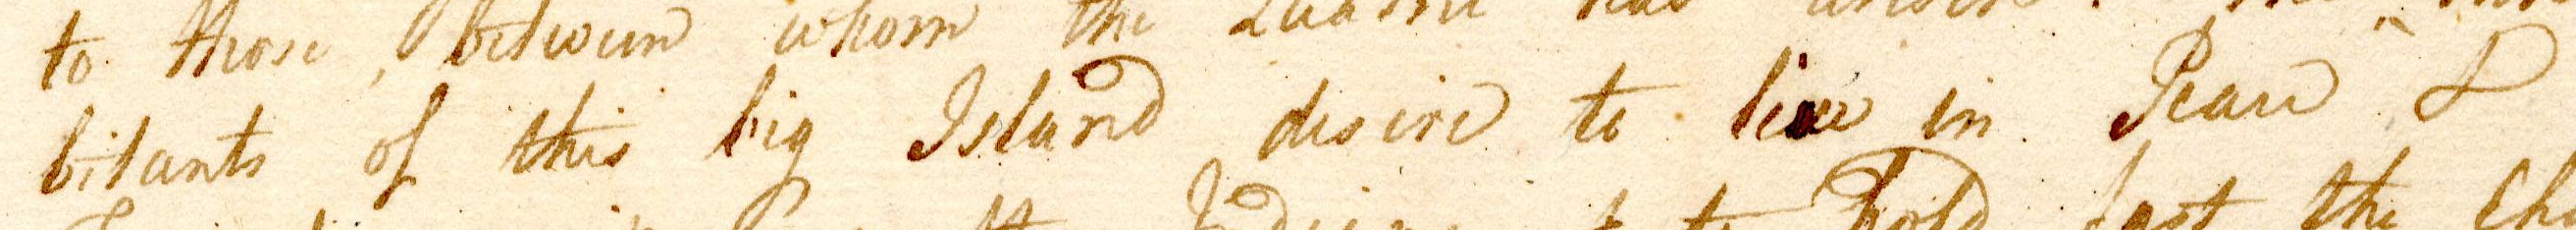bitants of this big Island desire to live in Peace &
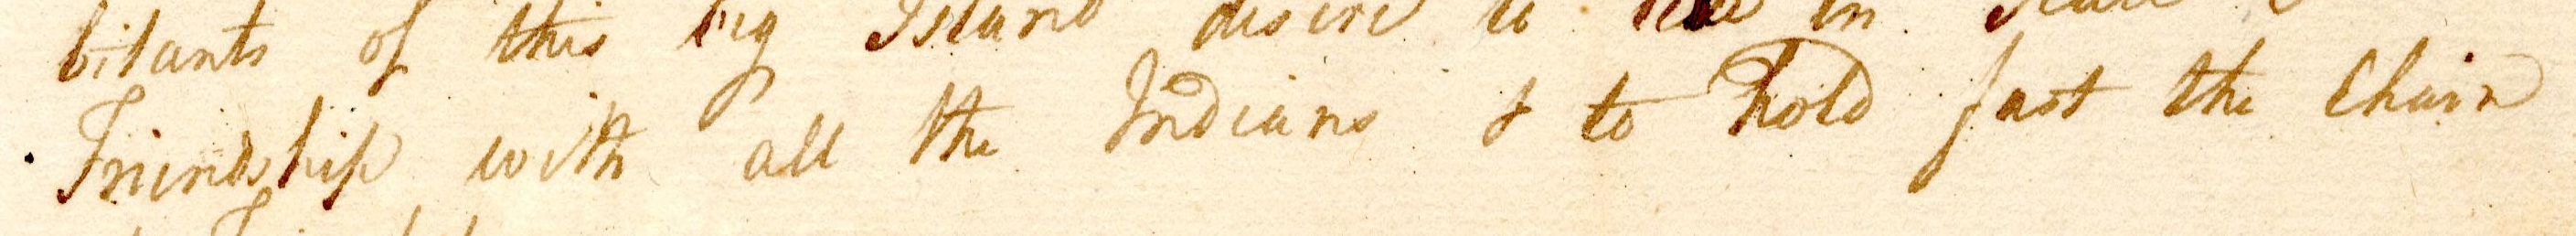Friendship with all the Indians & to hold fast the Chain
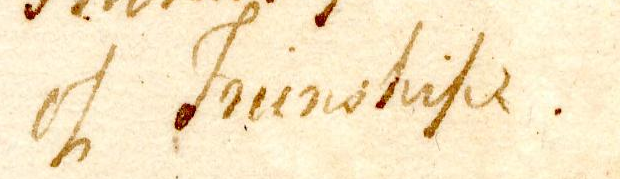of Friendship.
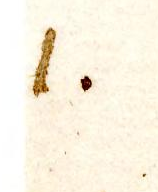1.
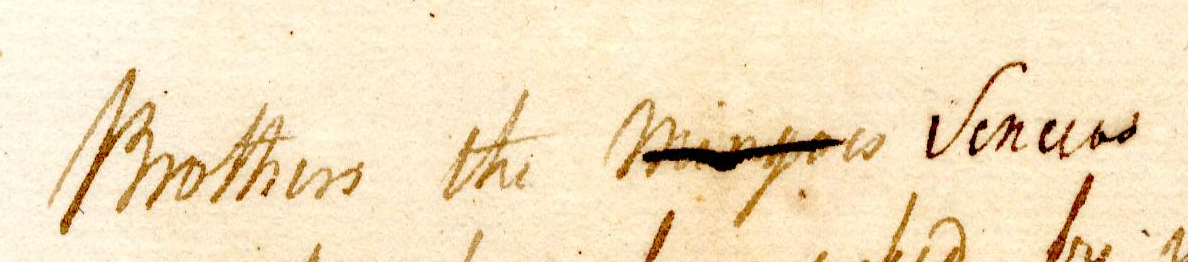Brothers the [Mingoes] Senecas
